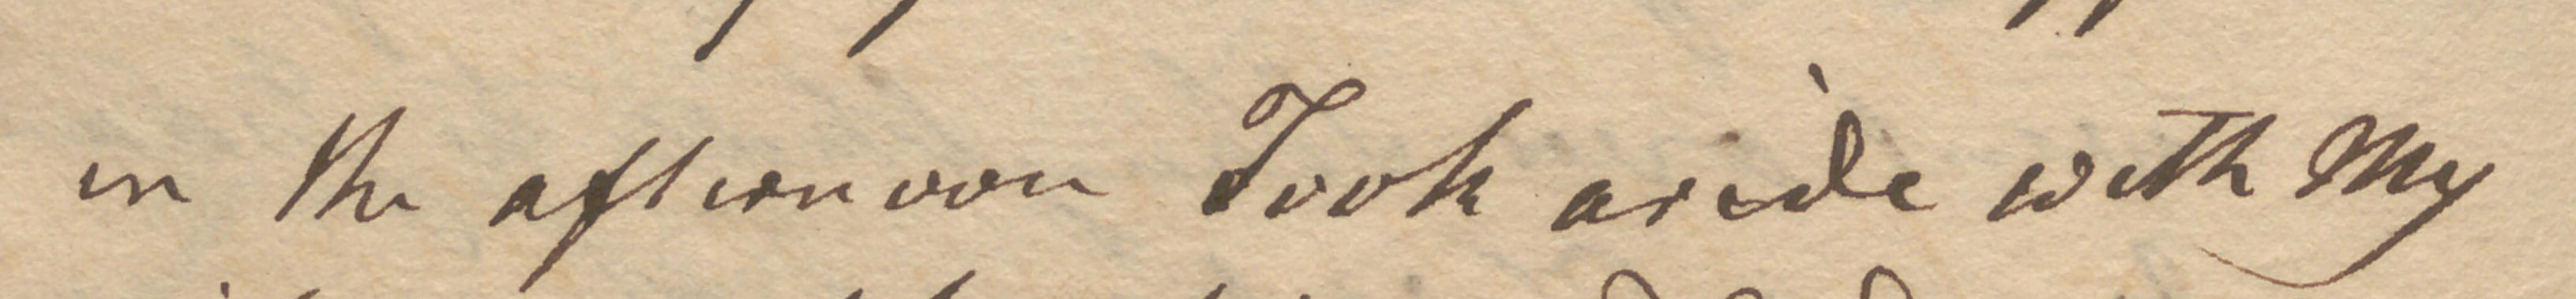in the afternoon Took a ride with My
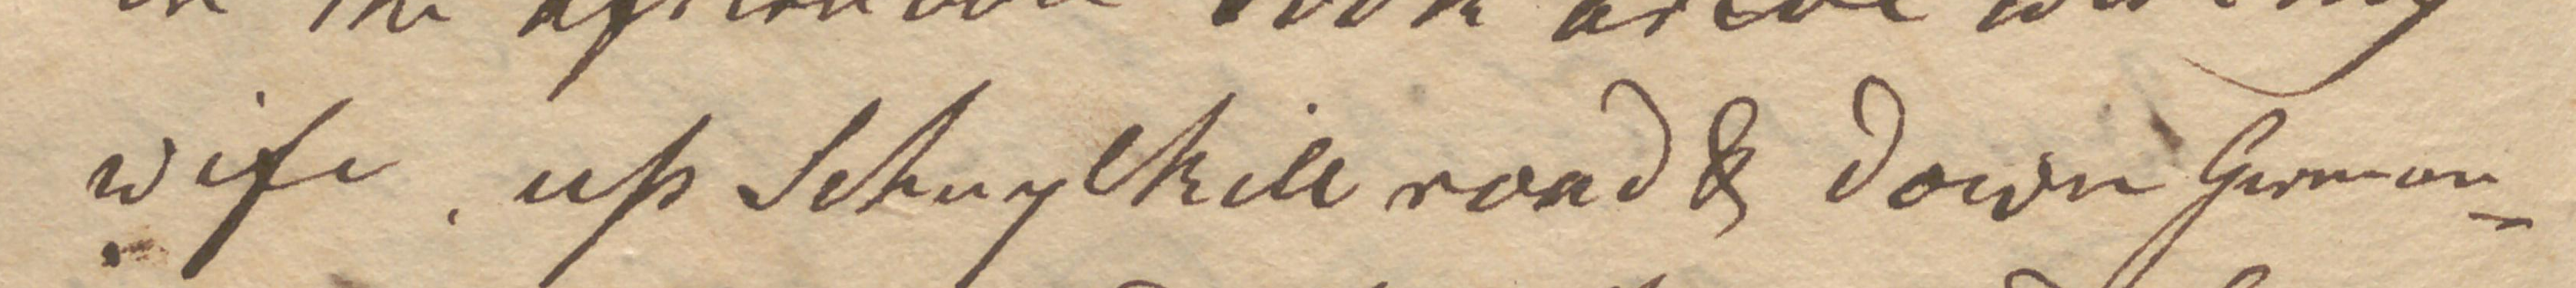wife. up Schuylkill road & down German-
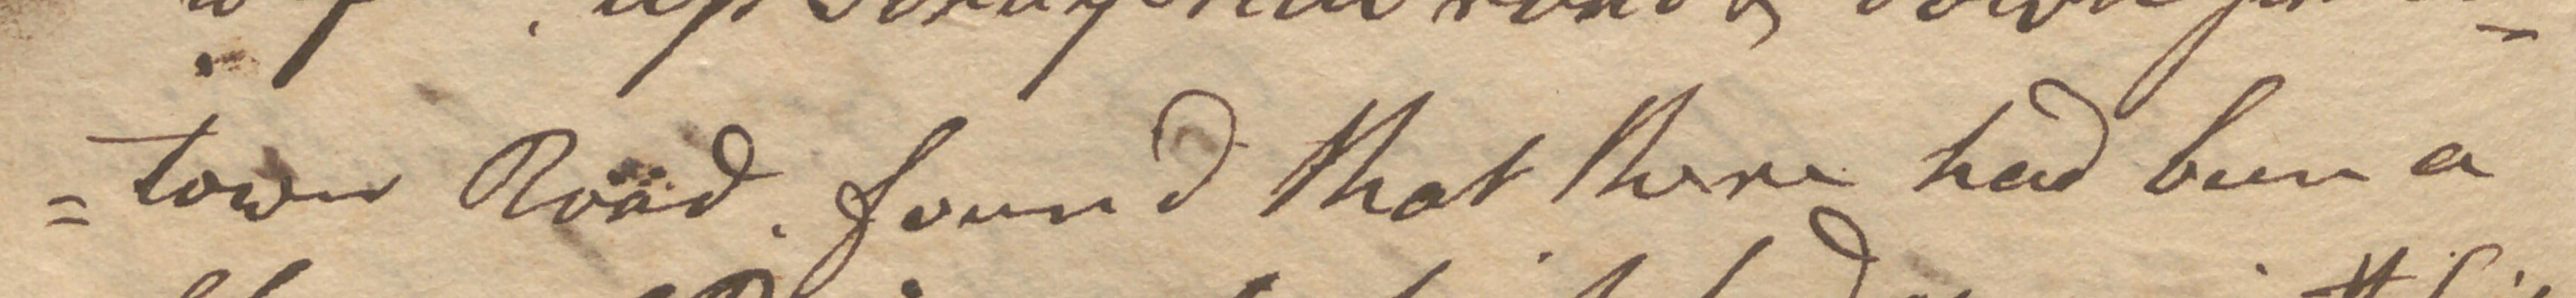-town Road found that there had been a
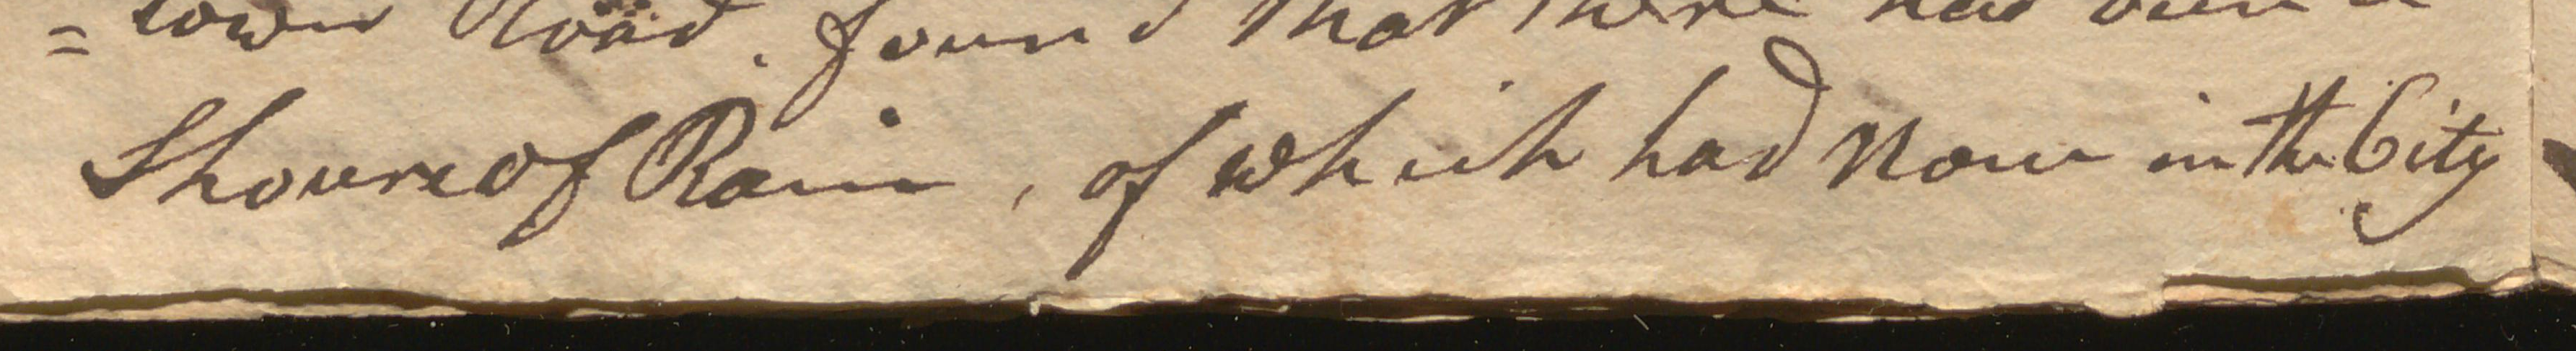Shoure of Rain, of which had now in the City
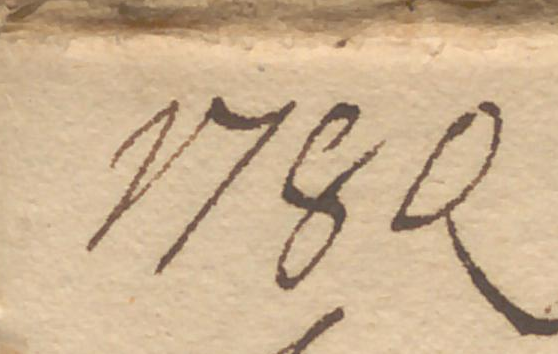1780
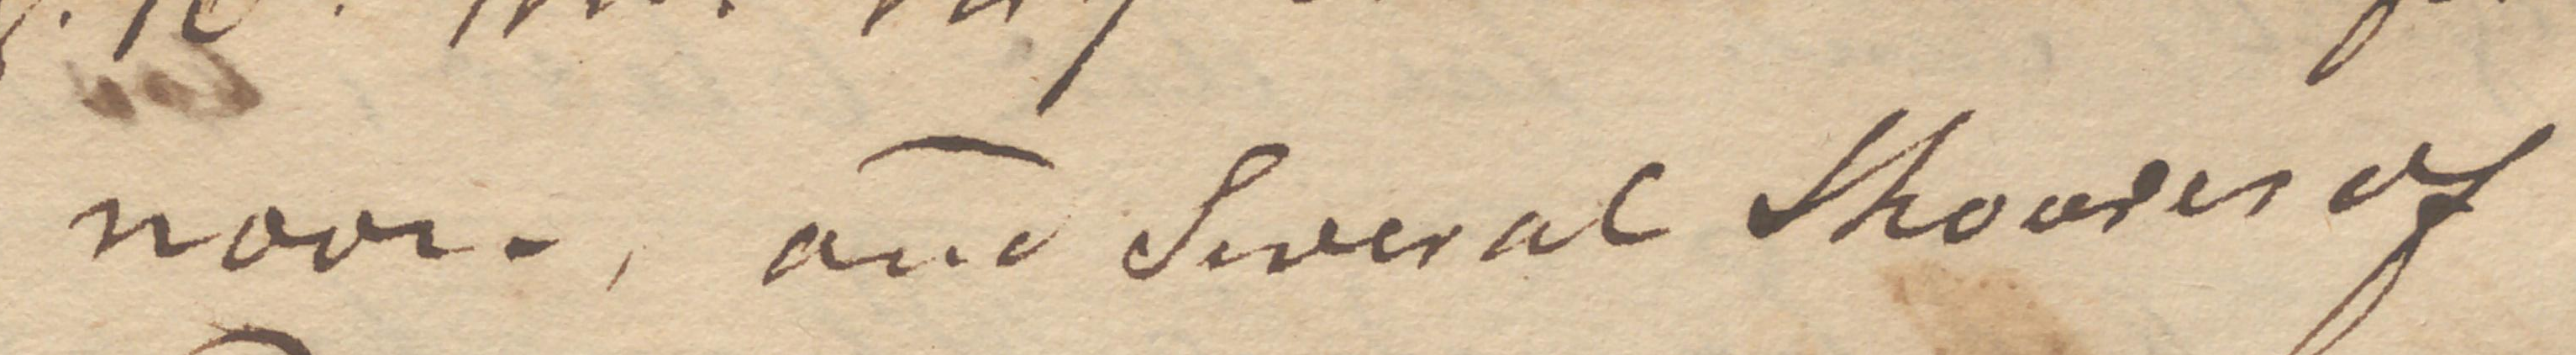noon, and Several Shoures of
